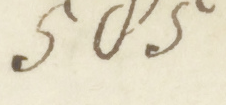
585
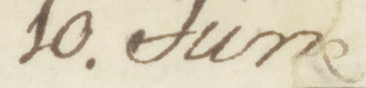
10. Jun
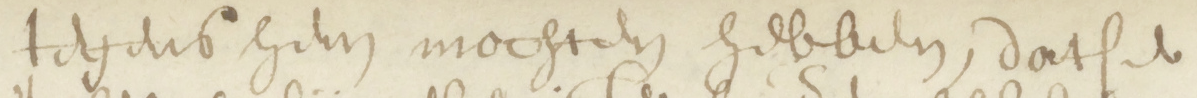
tegens hem mochten hebben, datse
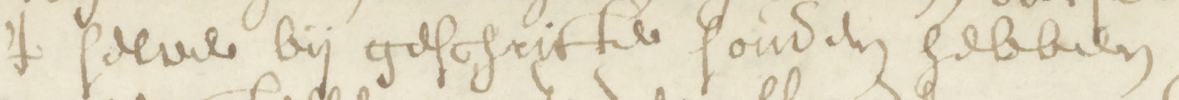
't selve bij geschrifte souden hebben
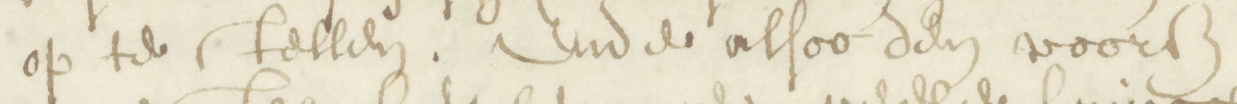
op te stellen. Ende alsoo den voors
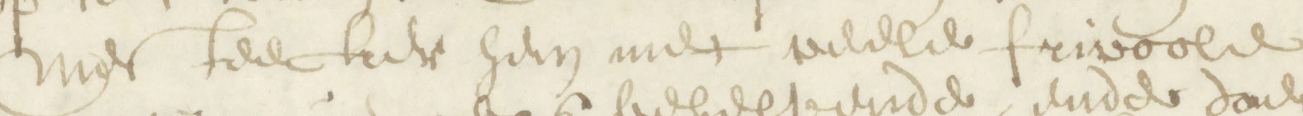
Mesteecker hem met veele frivoole
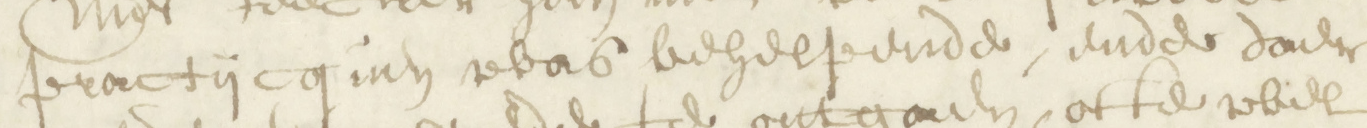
practijcquen was behelpende, ende daer
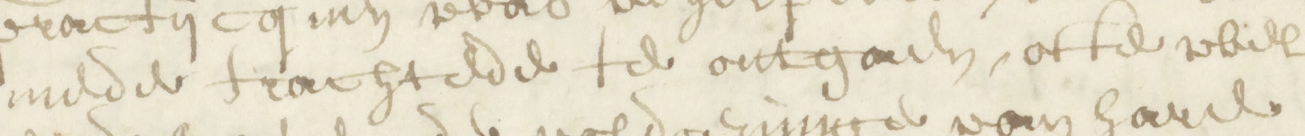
mede trachtede te ontgaen, ofte wel
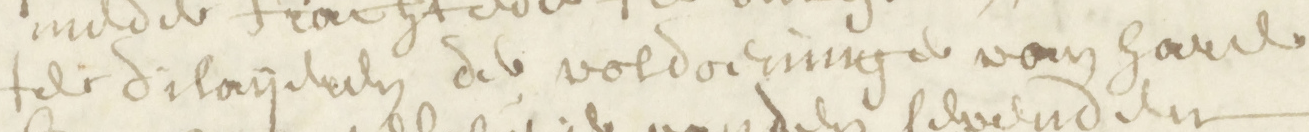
te dilaijeren de voldoeninge van hare
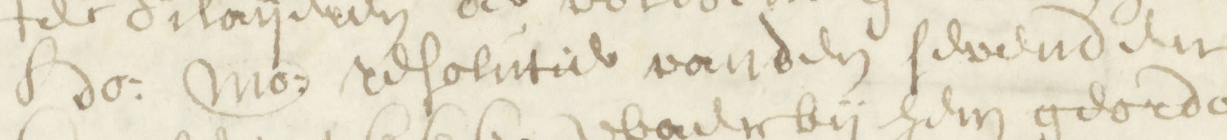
Ho:Mo: resolutie vanden sevenden
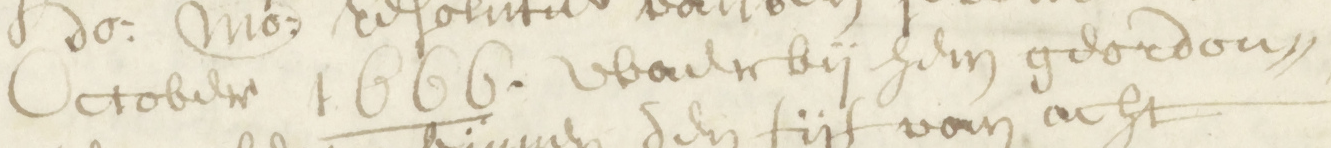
October 1666. waerbij hem geordon„
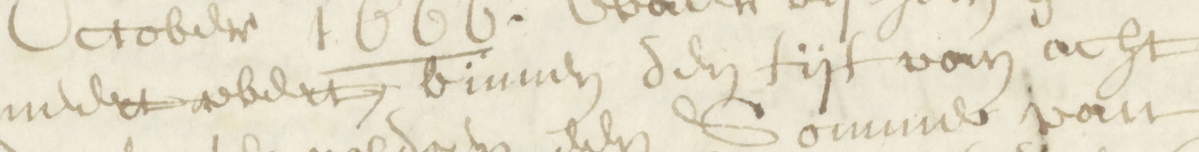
neert wert, binnen den tijt van acht
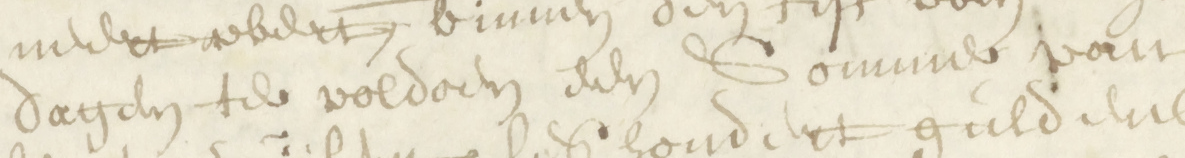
dagen te voldoen een Somme van
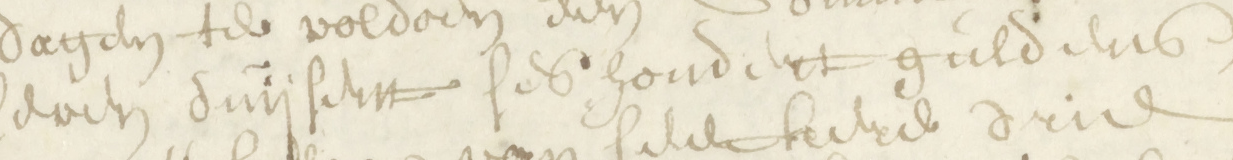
seven duijsent ses hondert guldens,
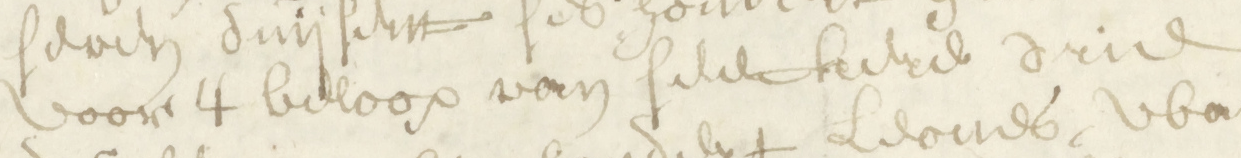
voor 't beloop van seeckere drie
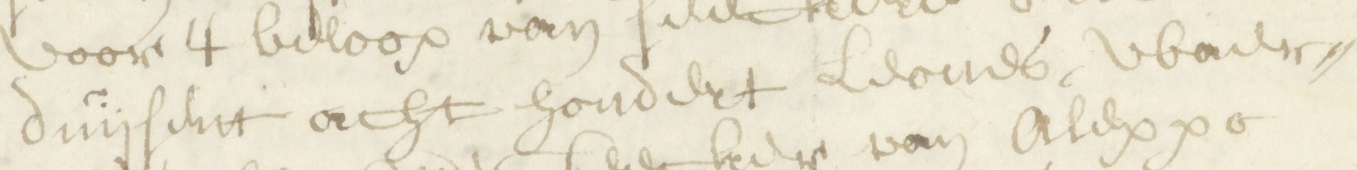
duijsent acht hondert Leones, waer„
